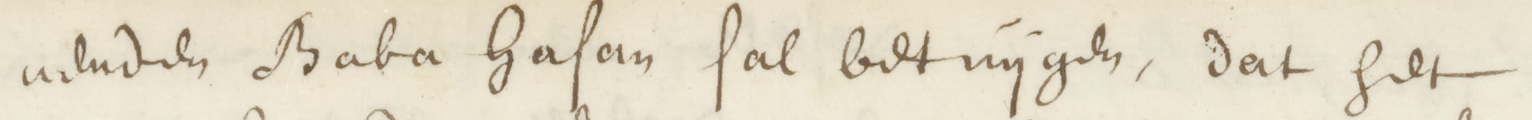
aenden Baba hasan sal betuijgen, dat het
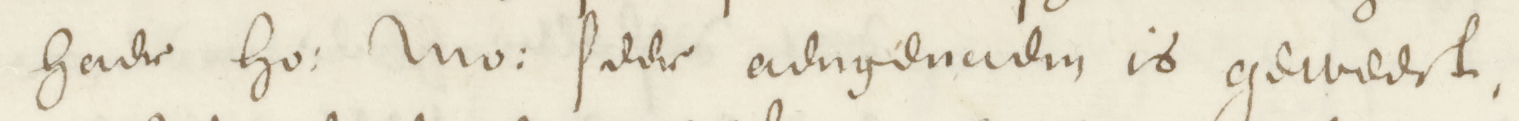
haer ho:mo: seer aengenaem is geweest,
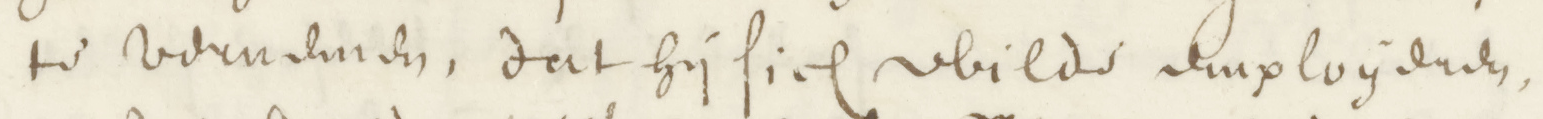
te vernemen, dat hij sich wilde emploijeren,
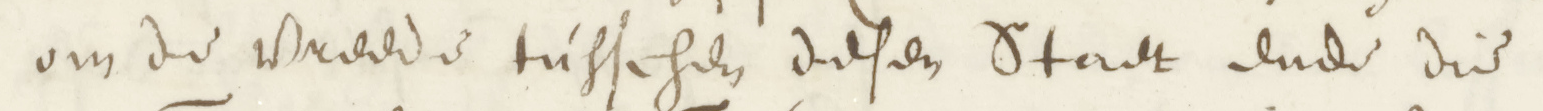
om de Vreede tusschen desen Staet ende die
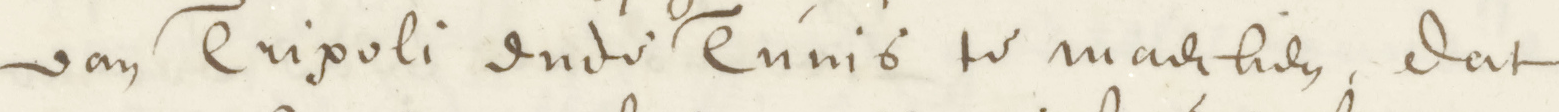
van Tripoli ende Tunis te maecken, dat
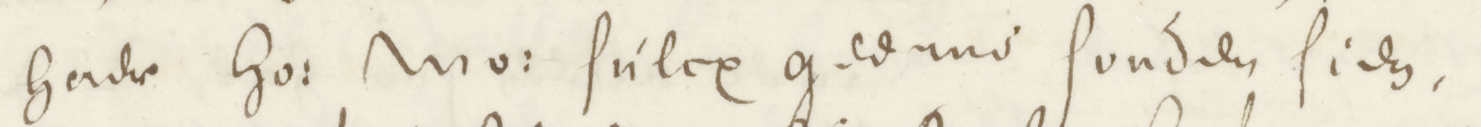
haer ho:mo: sulcx geerne souden sien,
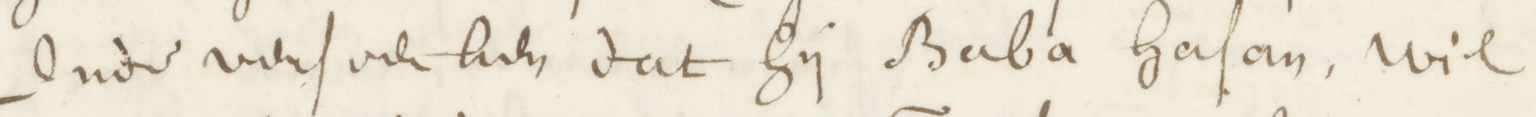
ende versoecken dat hij Baba hasan, wil
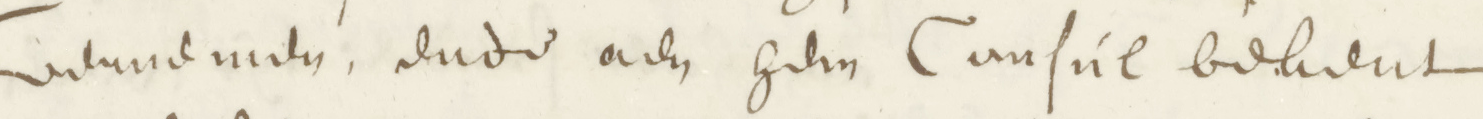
vernemen, ende aen hem Consul bekent
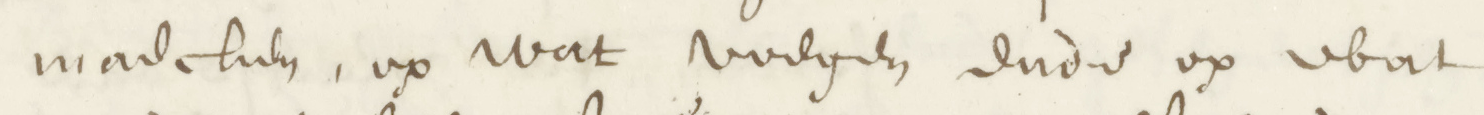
maecken, op wat voegen ende op wat
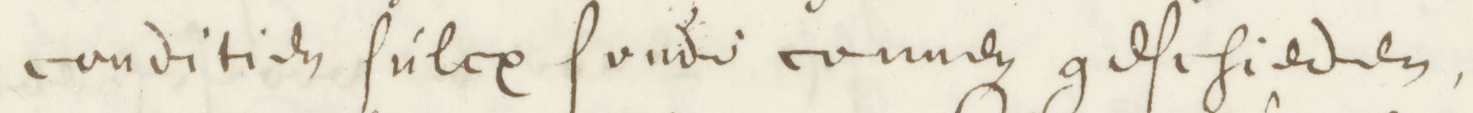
conditien sulcx soude connen geschieden
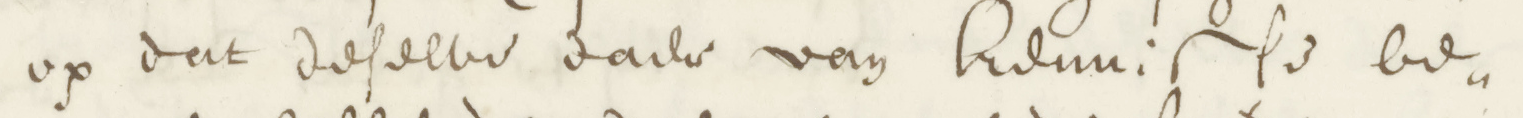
op dat deselve daer van kennisse be„
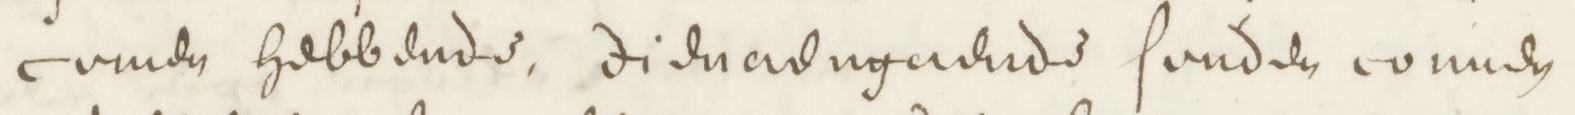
comen hebbende, dienaengaende souden connen
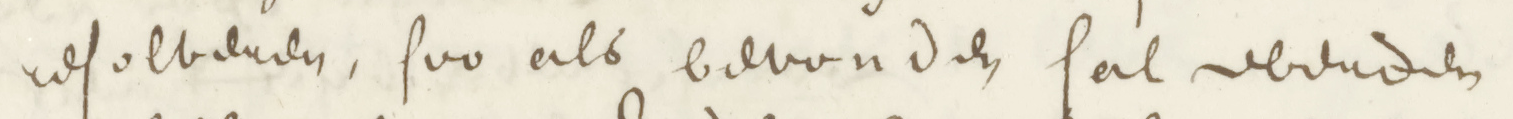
resolveren, soo als bevonden sal werden
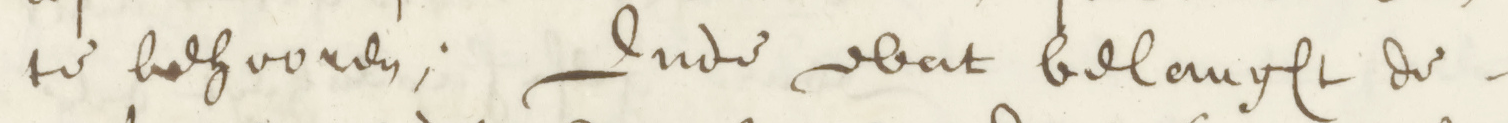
te behooren; Ende wat belanght de
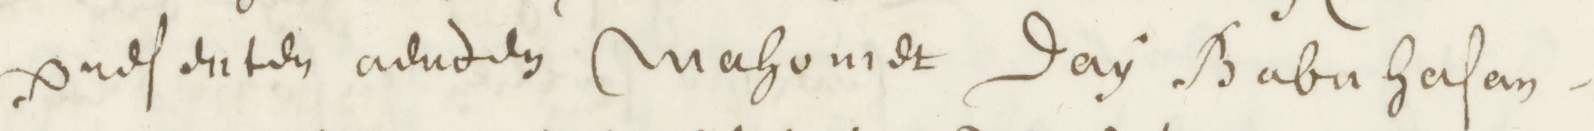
presenten aenden Mahomet Daij Baba hasan
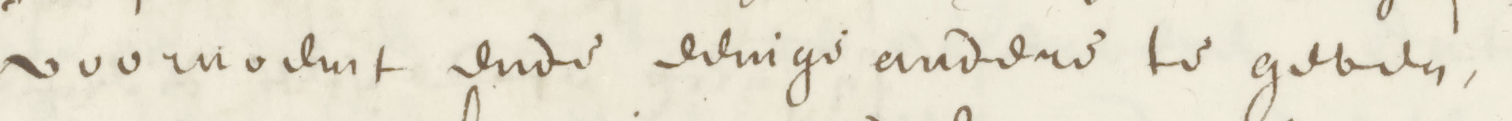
voornoemt ende eenige andere te geven,
